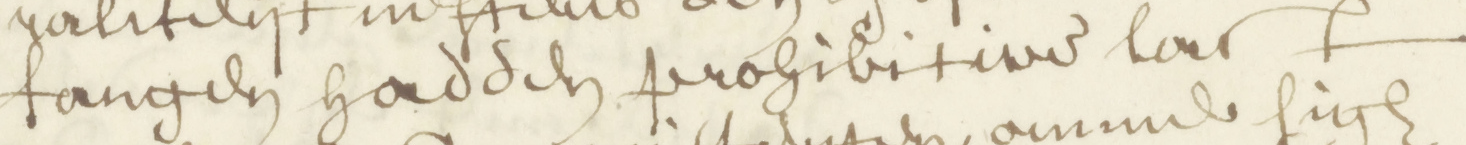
fangen hadden prohibitive last
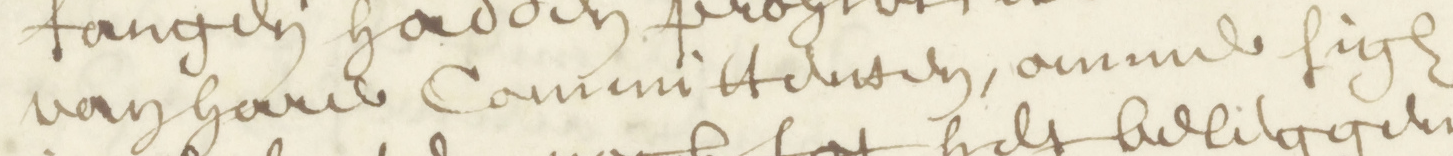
van hare Committenten, omme sigh
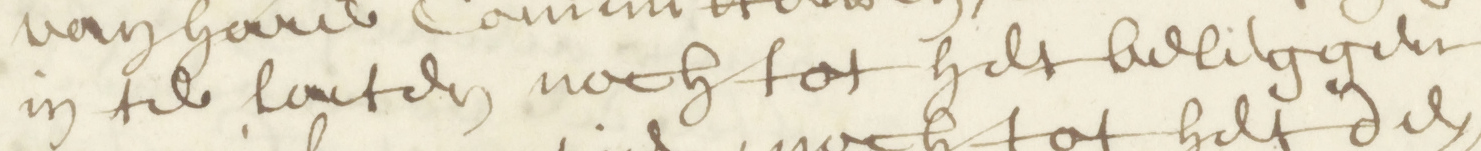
in te laten noch tot het beleggen
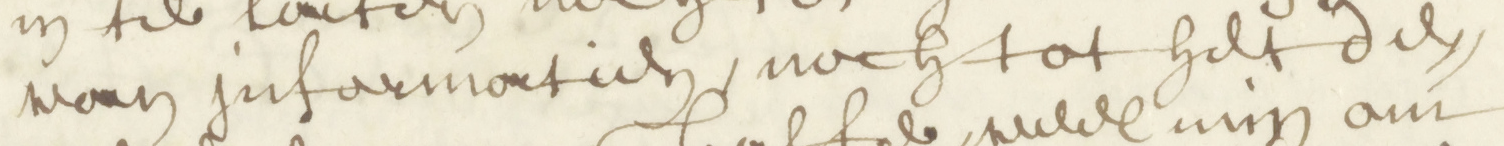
van informatien, noch tot het de„
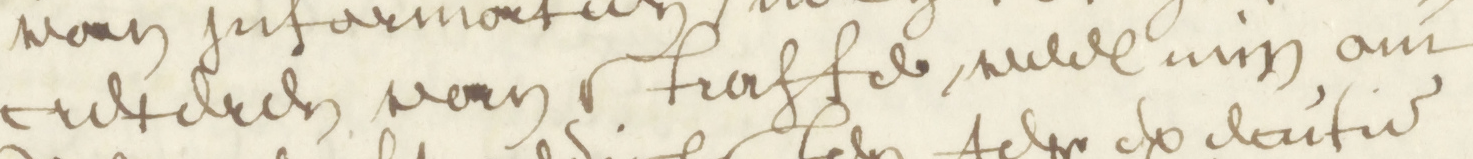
creteren van straffe, veel min om
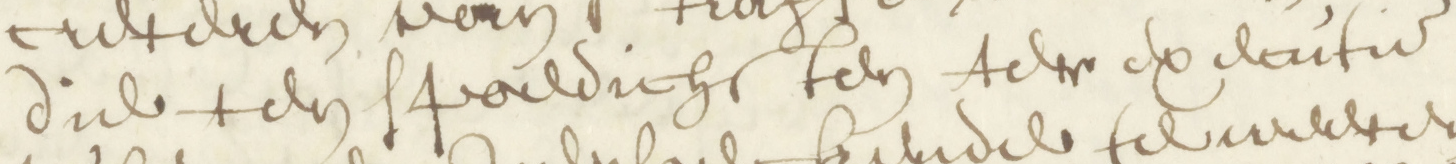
die ten spoedichsten ter executie
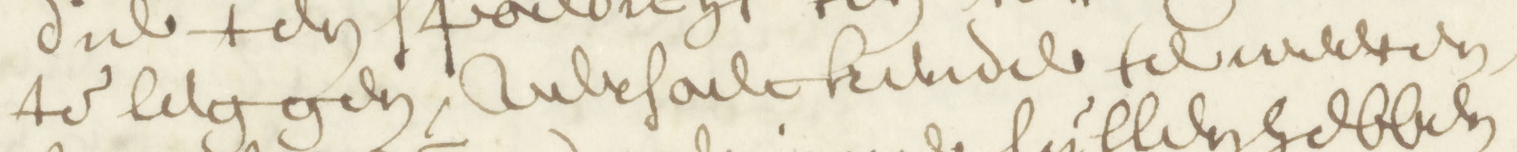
te leggen, versoeckende te weeten
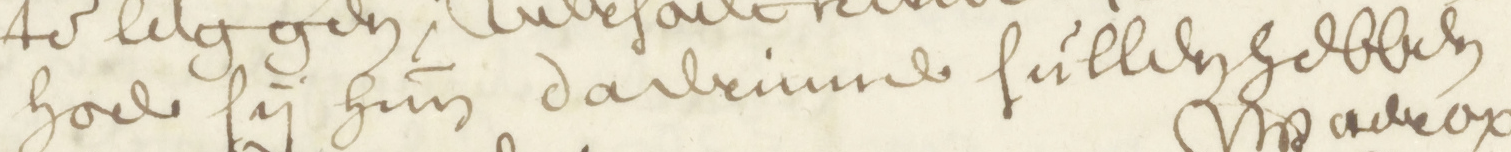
hoe in hun daerinne sullen hebben
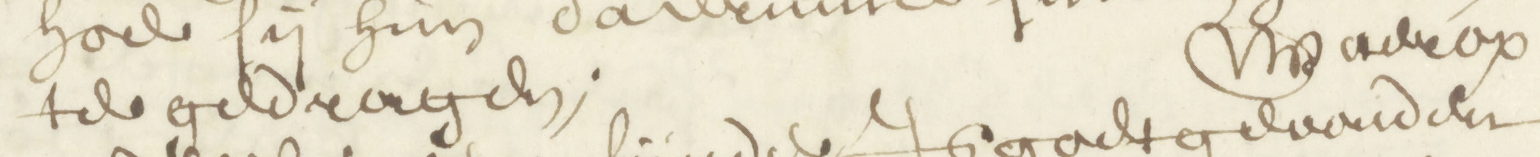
te gedragen: Waerop
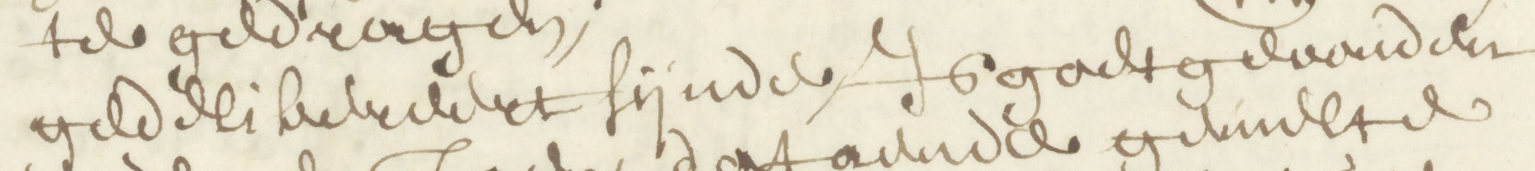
gedelibereert sijnde, Is goetgevonden
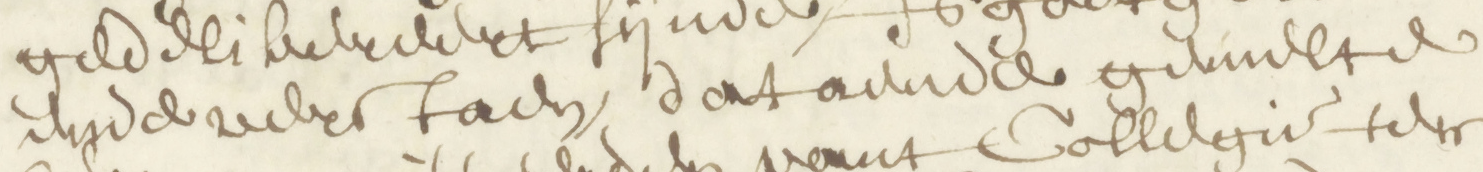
ende verstaen, dat aende gemelte
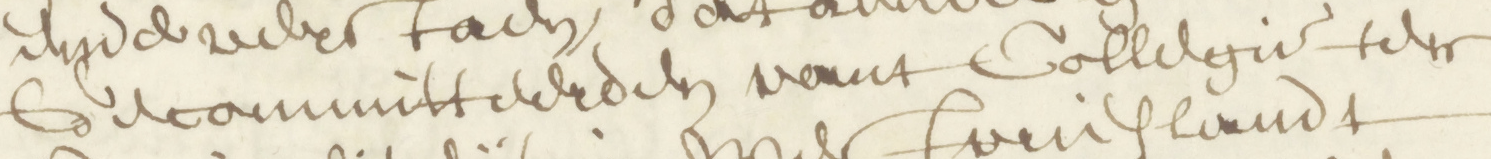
Gecommitteerden vant Collegie ter
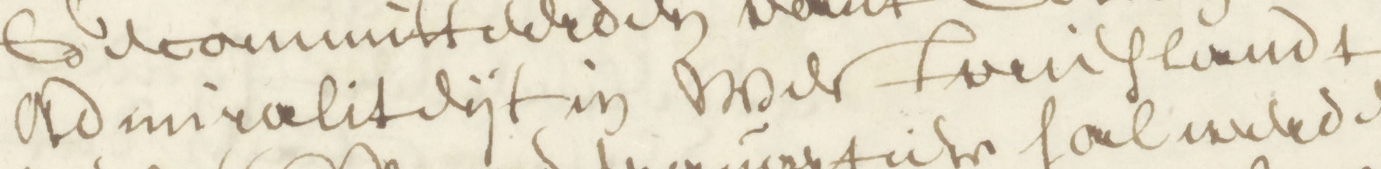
Admiraliteijt in Westvrieslandt
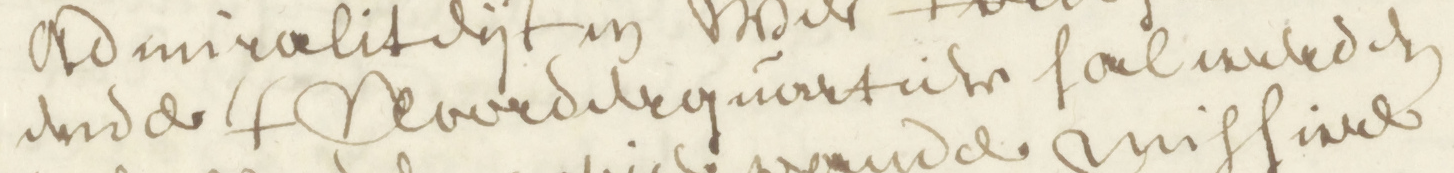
ende 't Noorderquartier sal werden
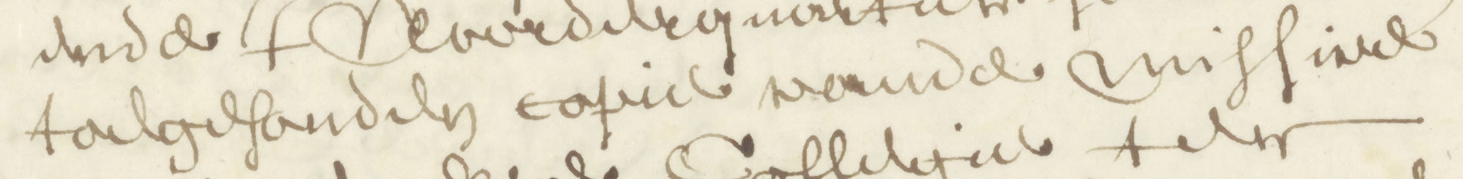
toegesonden copie vande missive
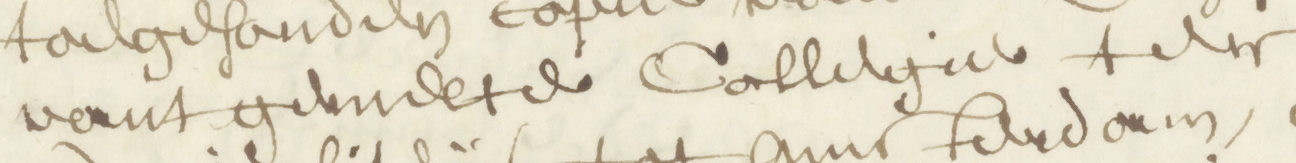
vant gemelte Collegie ter
